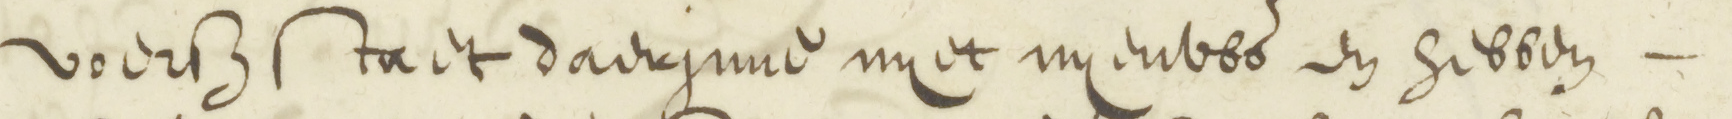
voers Staet daerinne nyet nyeuws en hebben —
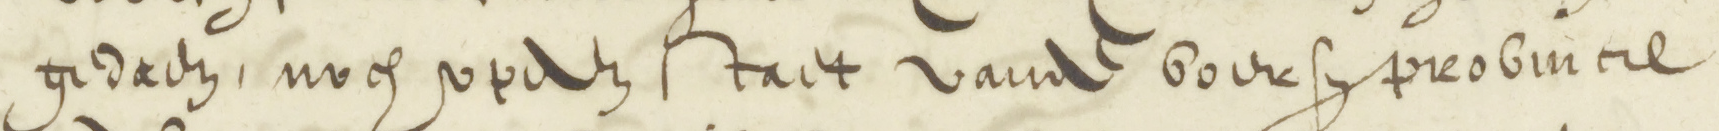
gedaen, noch opden Staet vande voers provincie
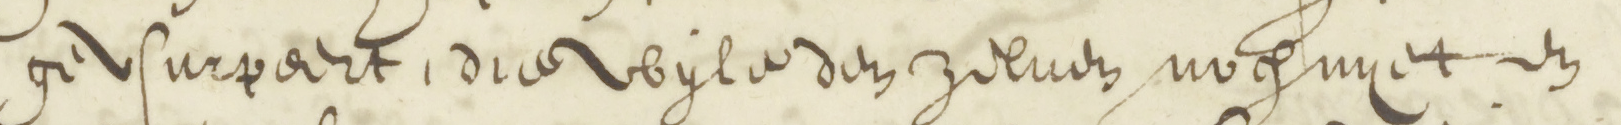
gevsurpeert, diewijle den zeluen noch nyet en
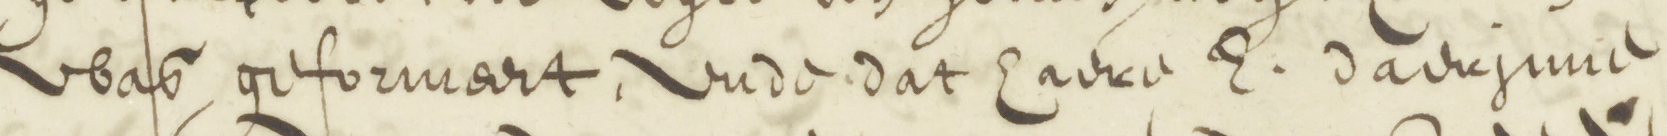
was geformeert, ende dat haere E. daerinne
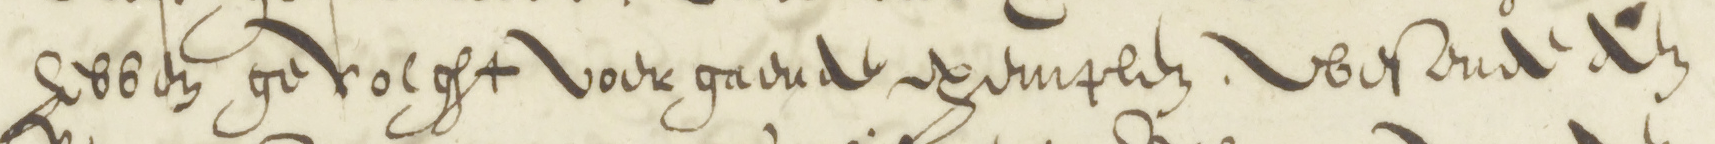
hebben gevolght voergaende exemplen. Wesende den
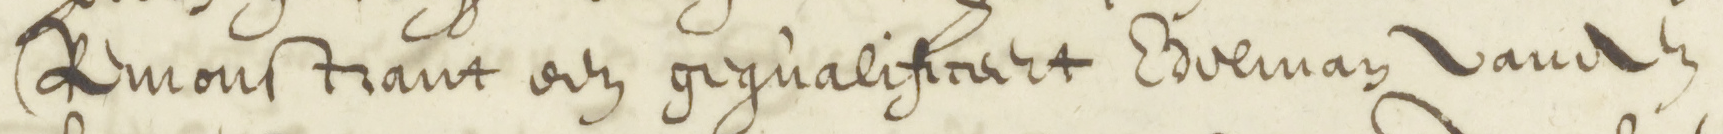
Remonstrant een gequalificeert Edelman vanden
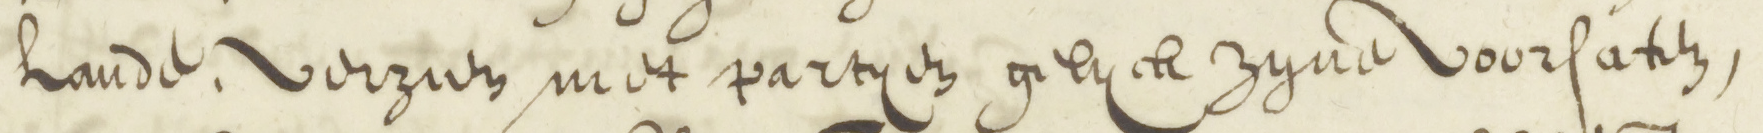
Lande, verzien met partyen gelyck zyne voorsaten,
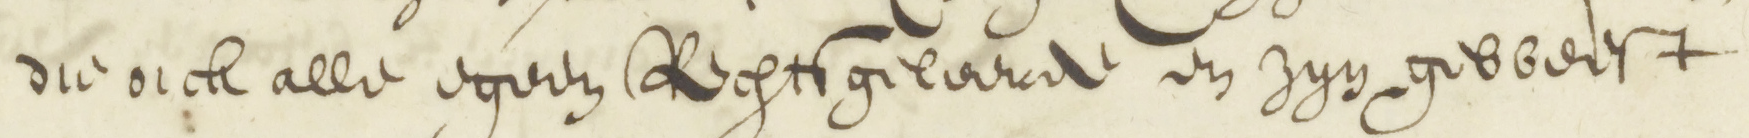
die oick alle egeen Rechtsgeleerde en zijn geweest
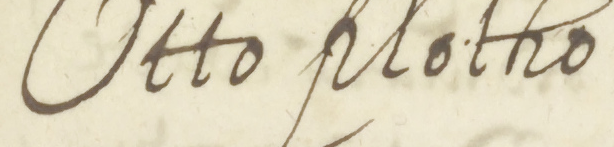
Otto Plotho
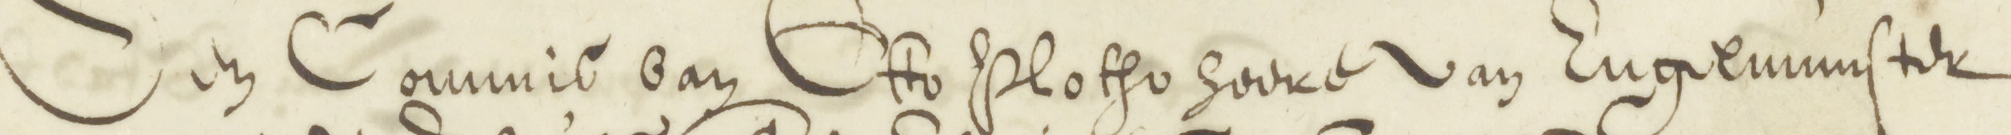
Den Commis van Otto Plotho heere van Engelmunster
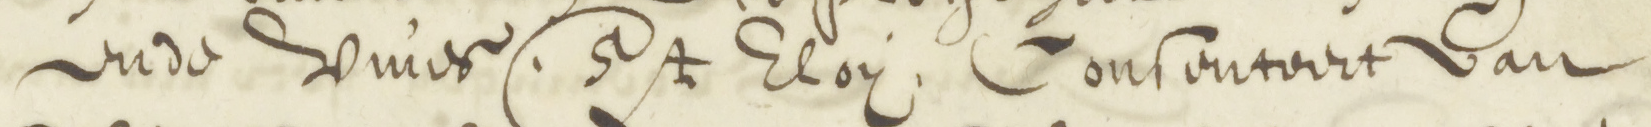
ende Viues, St. Eloy, Consenteert van
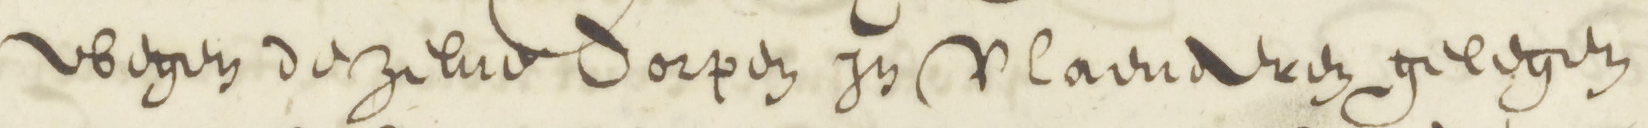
wegen dezelue dorpen in Vlaenderen gelegen
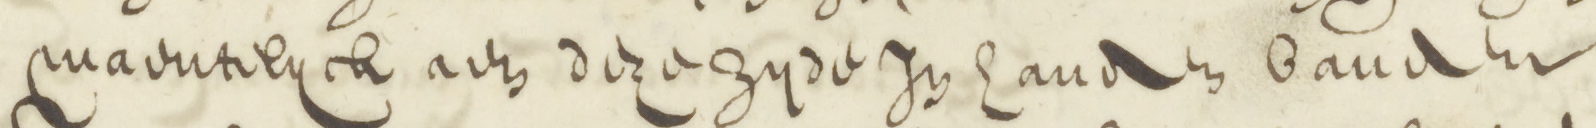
maentelyck aen deze zyde In handen vanden
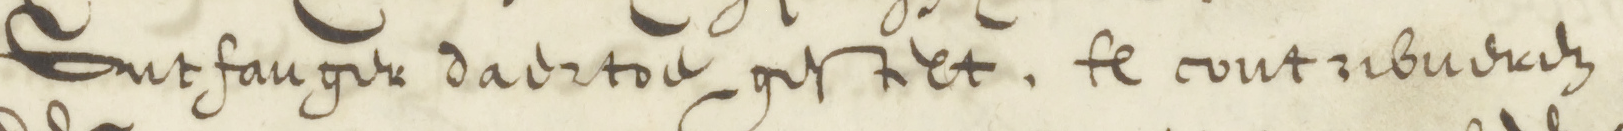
Ontfanger daertoe gestelt, te contribueren
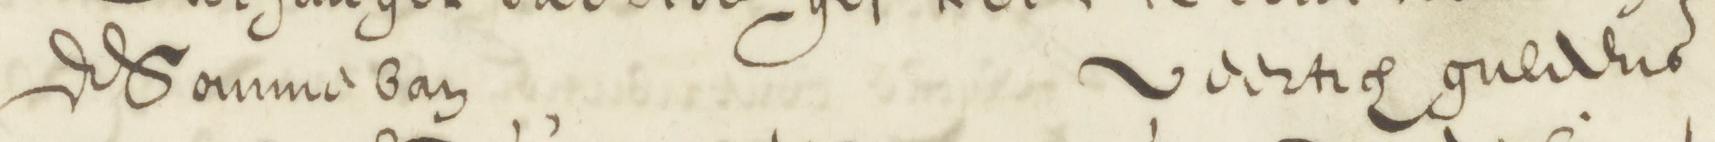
de Somme van veertich guldens
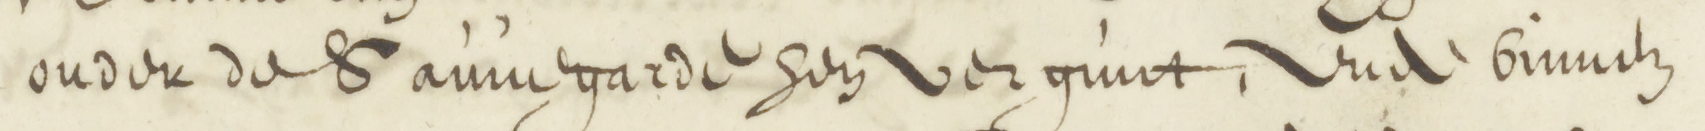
onder de sauuegarde hen vergunt, ende binnen
